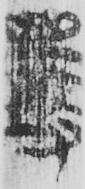襄（讓）
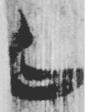㠯（以）
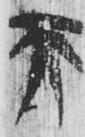天
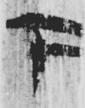下
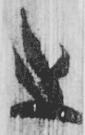之
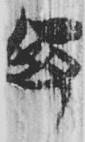臤（賢）
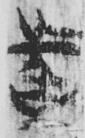者
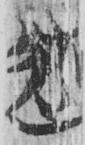述（遂）
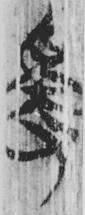爯（稱）
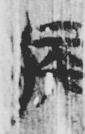疾
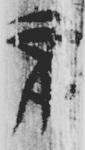不
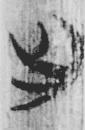出
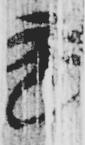而
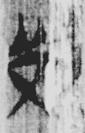死
